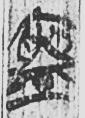{寅皿}
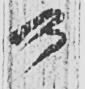乃
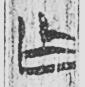乍
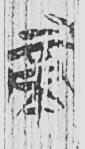帝
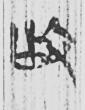{乍攴}
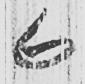㠯（以）
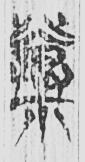{登示}
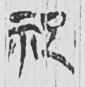祀
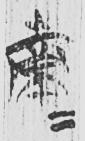{上帝}=
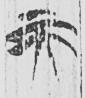天
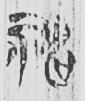神
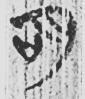名
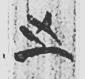之
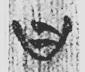曰
